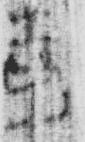可
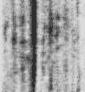兌（悅）
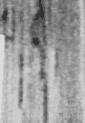也
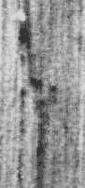句（苟）
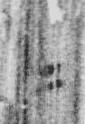㠯（以）
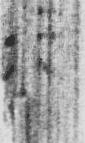亓（其）
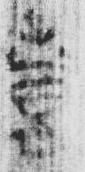情
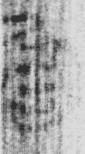唯
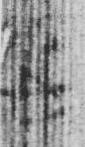○（過）
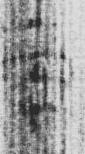不
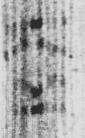亞（惡）
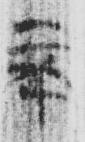不
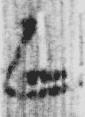㠯（以）
